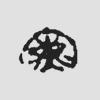熱
